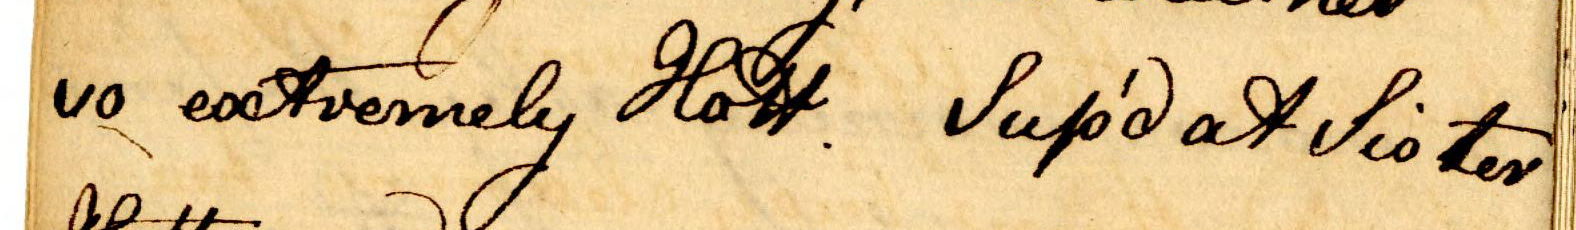so extremely Hott. Sup'd at Sister
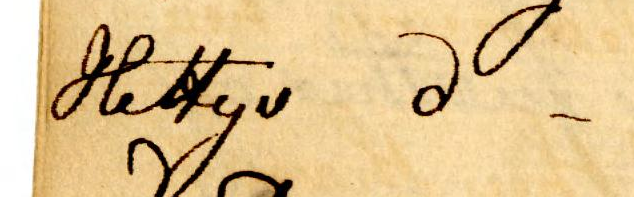Hettys d-
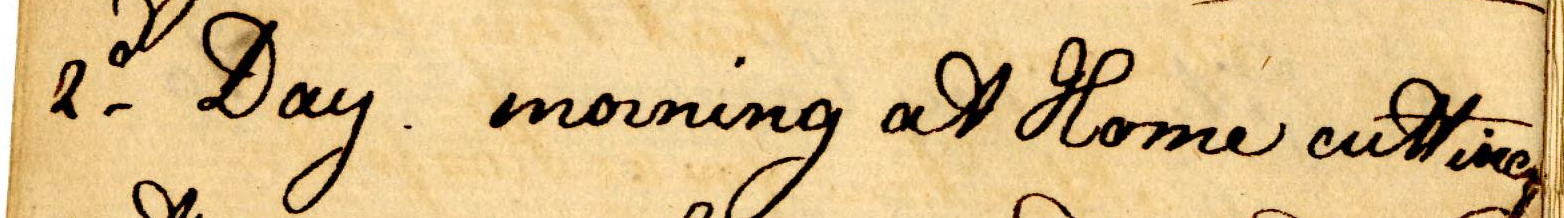2^d Day. morning at Home cutting
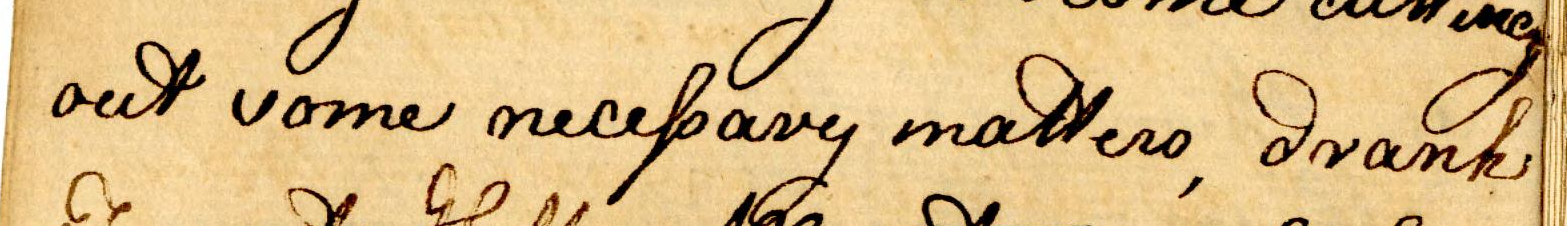out some necessary matters, drank
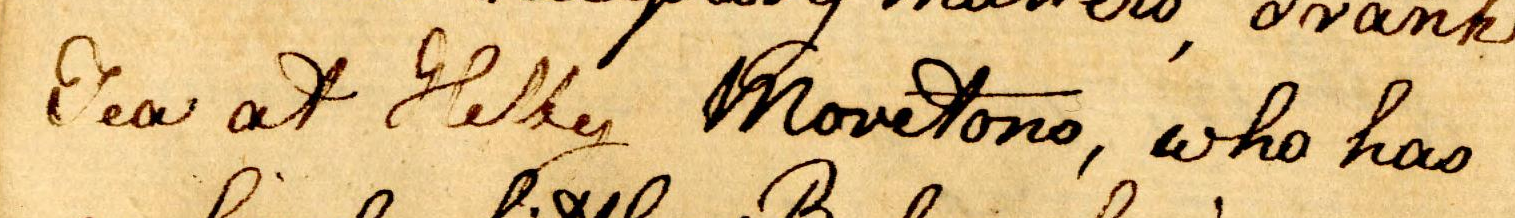Tea at Hetty Moretons, who has
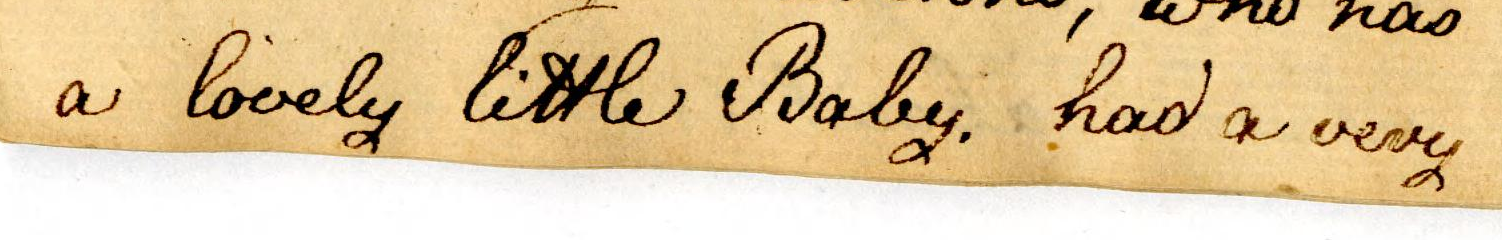a lovely little Baby. had a very
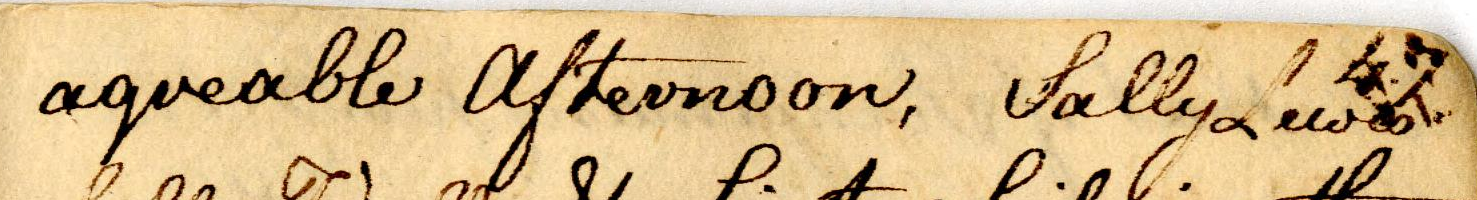agreable Afternoon, Sally Lewis
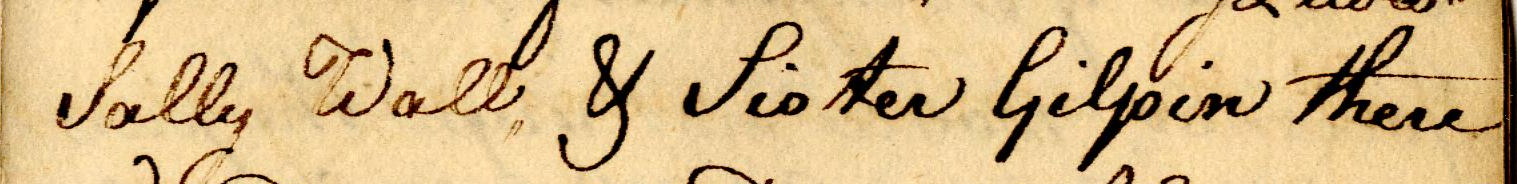Sally Wall, & Sister Gilpin there
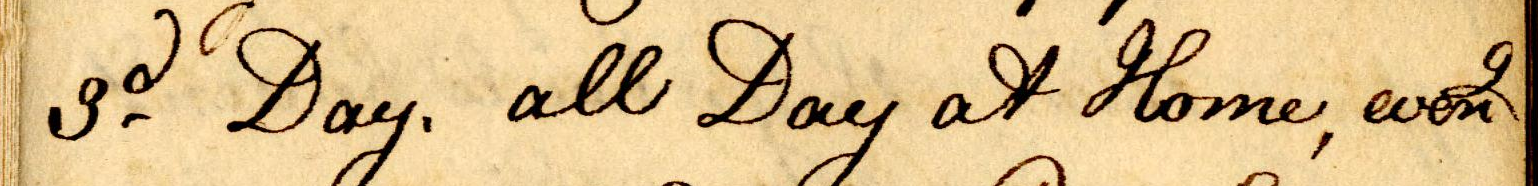3^d Day. all Day at Home, even^g
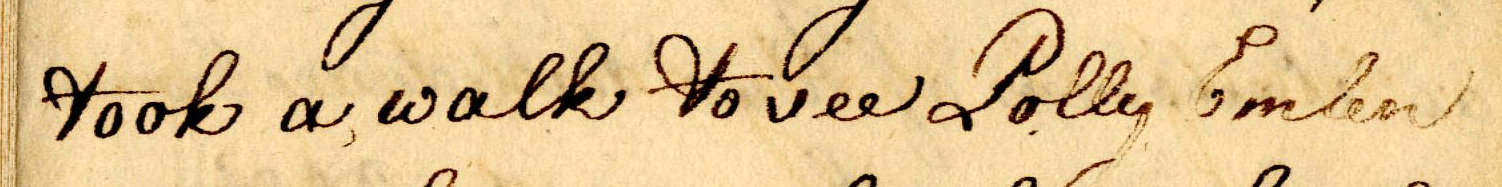took a walk to see Polly Emlen
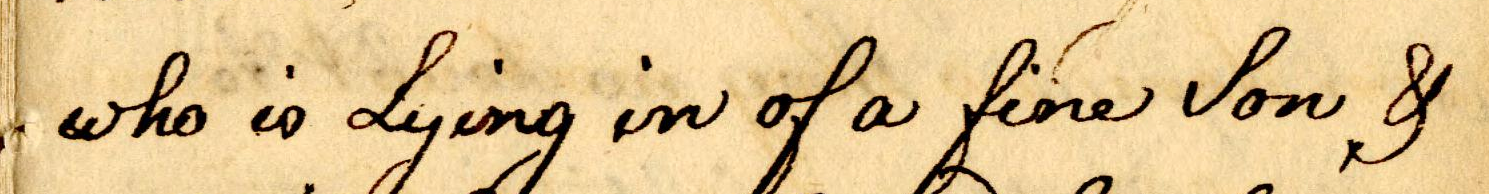who is Lying in of a fine Son &
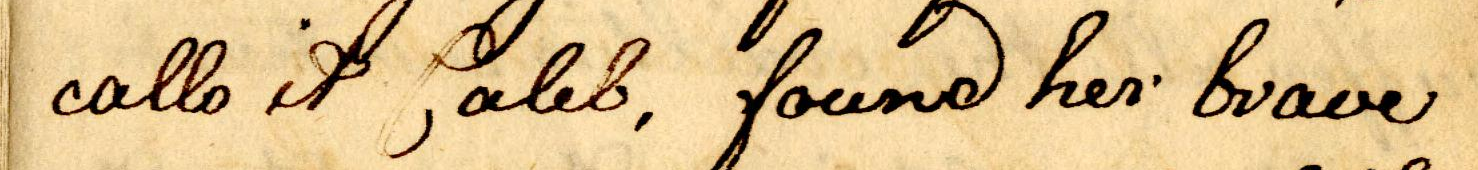calls it Caleb, found her brave
